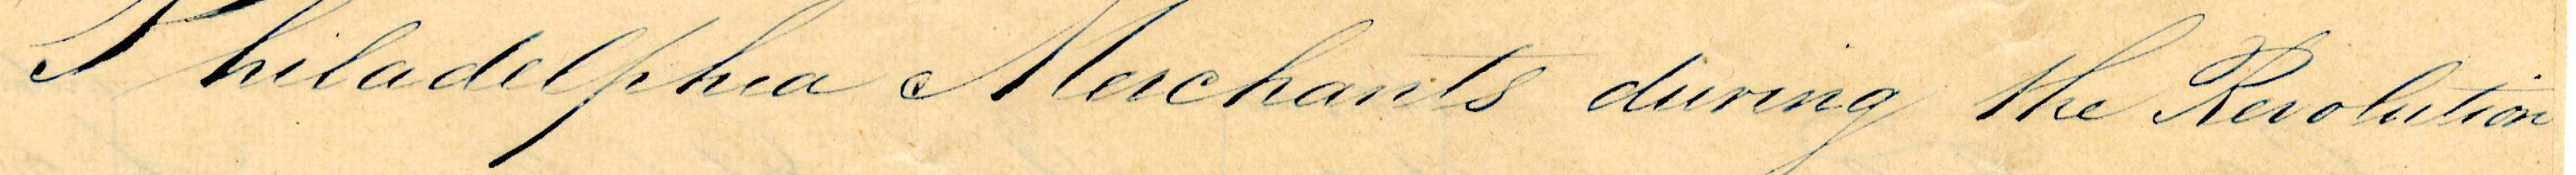Philadelphia Merchants during the Revolution
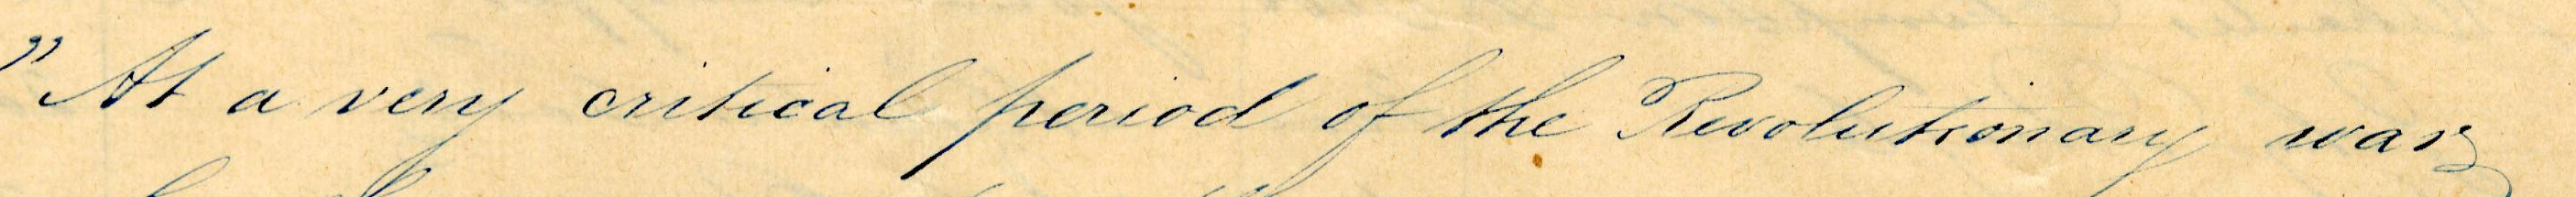"At a very critical period of the Revolution was
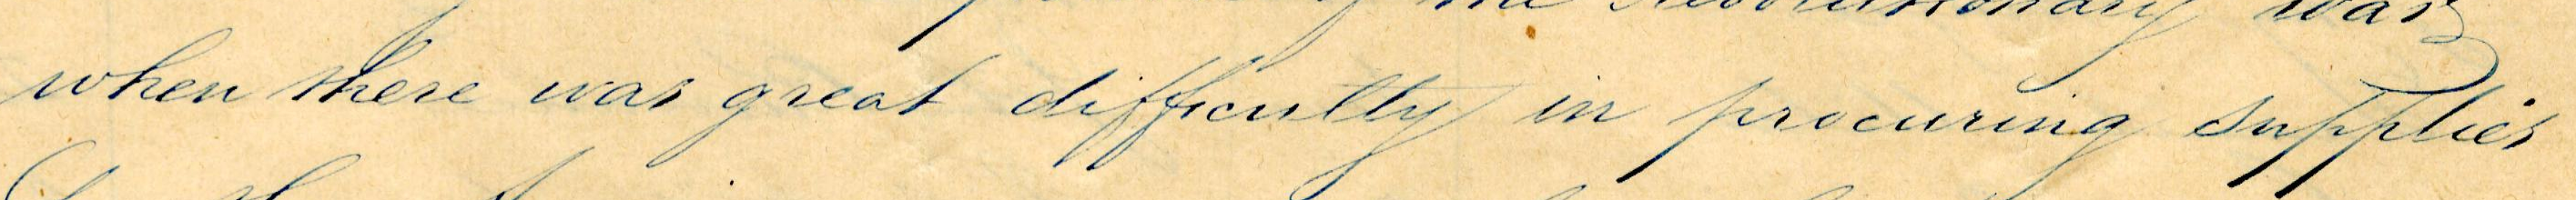when there was a great difficulty in procuring supplies
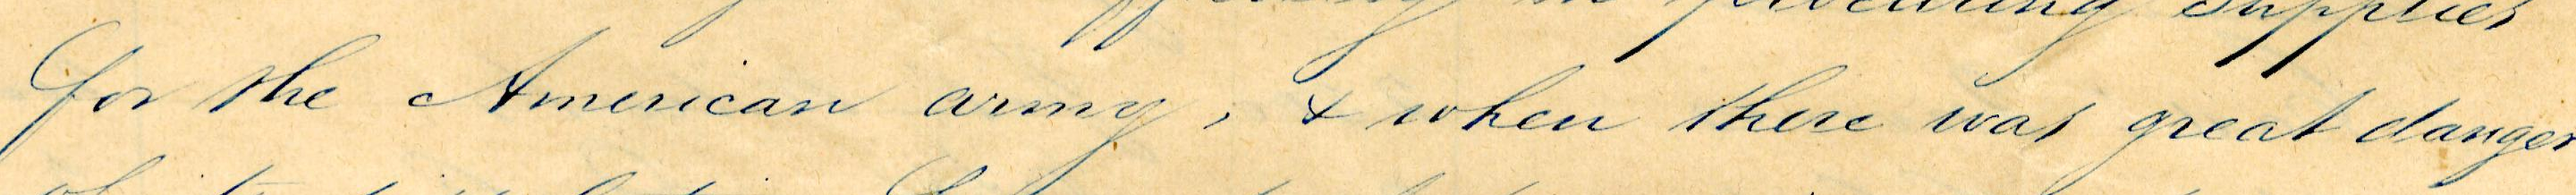for the American Army, & when there was great danger
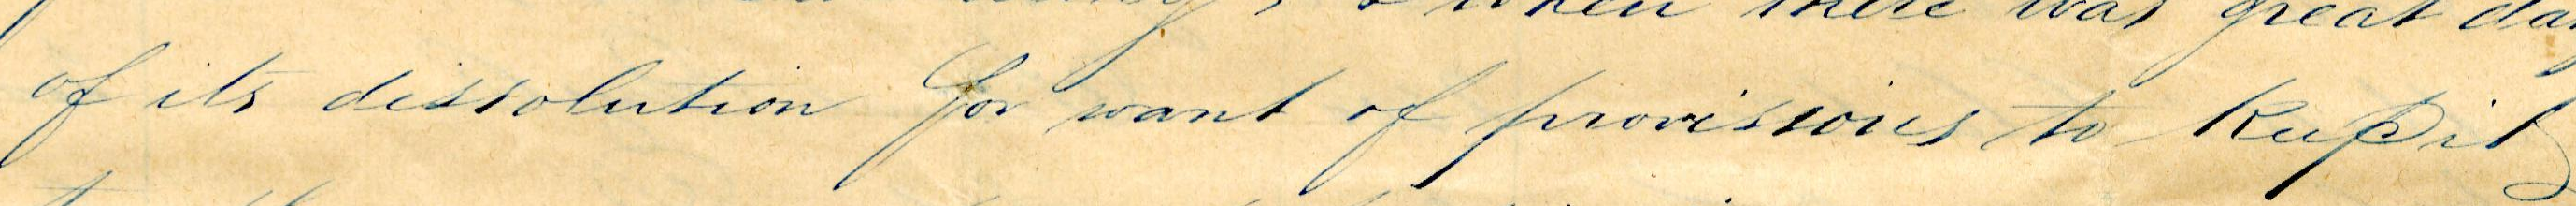of its dissolution for want of provisions to keep it
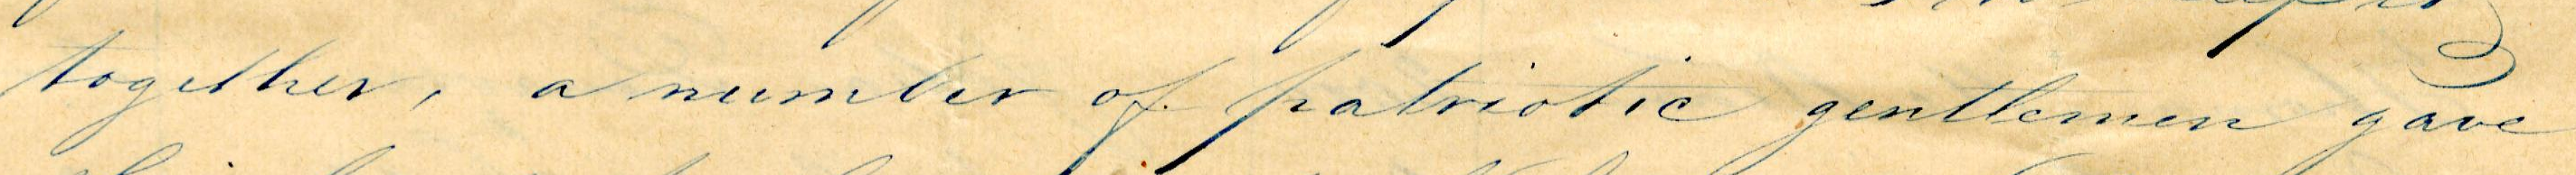together, a number of patriotic gentlemen gave
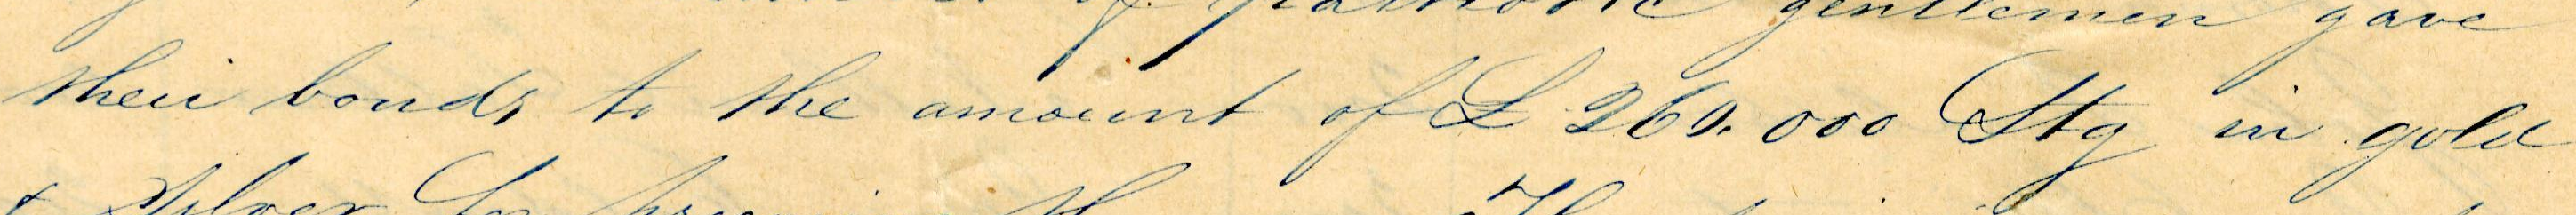their bonds to the amount of £260,000 Stg in gold
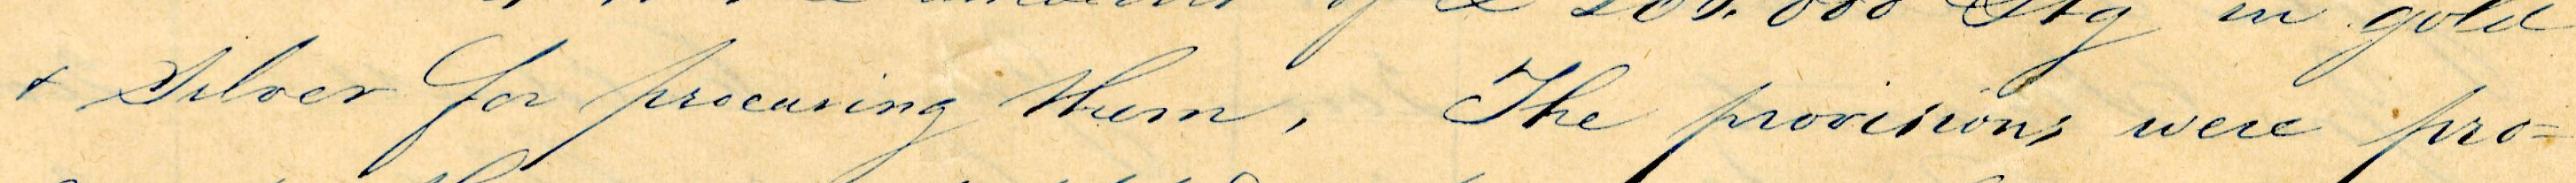& silver for procuring items, The provisions were pro-
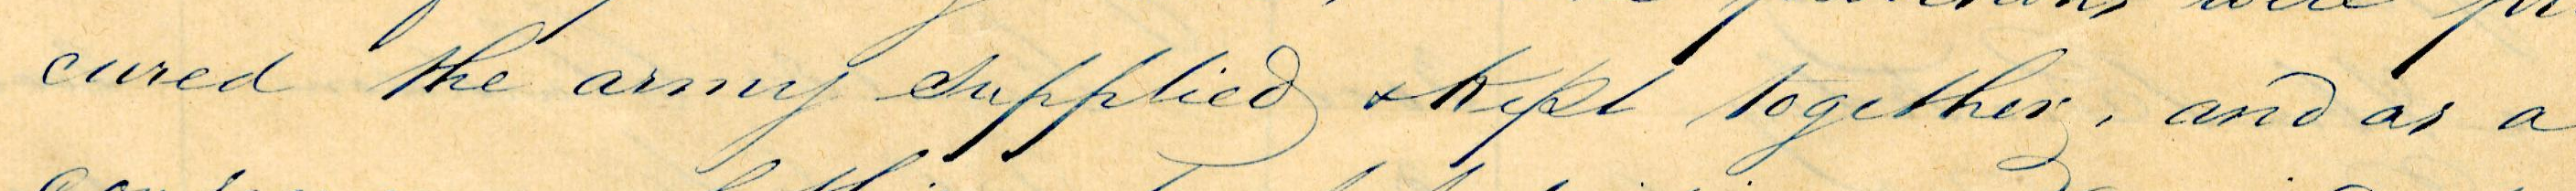-cured the army supplied & held together, and as a
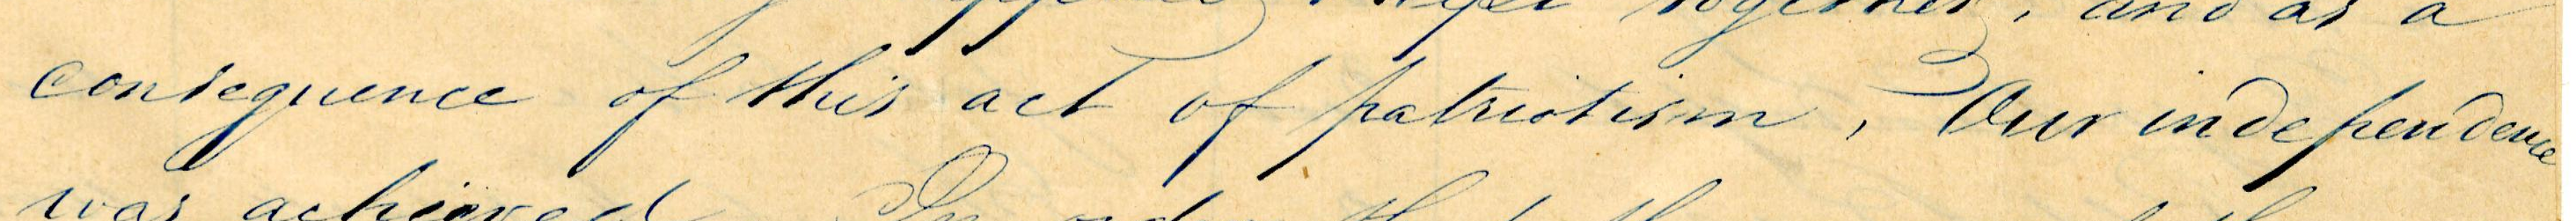consequence of this act of patriotism, our independence
